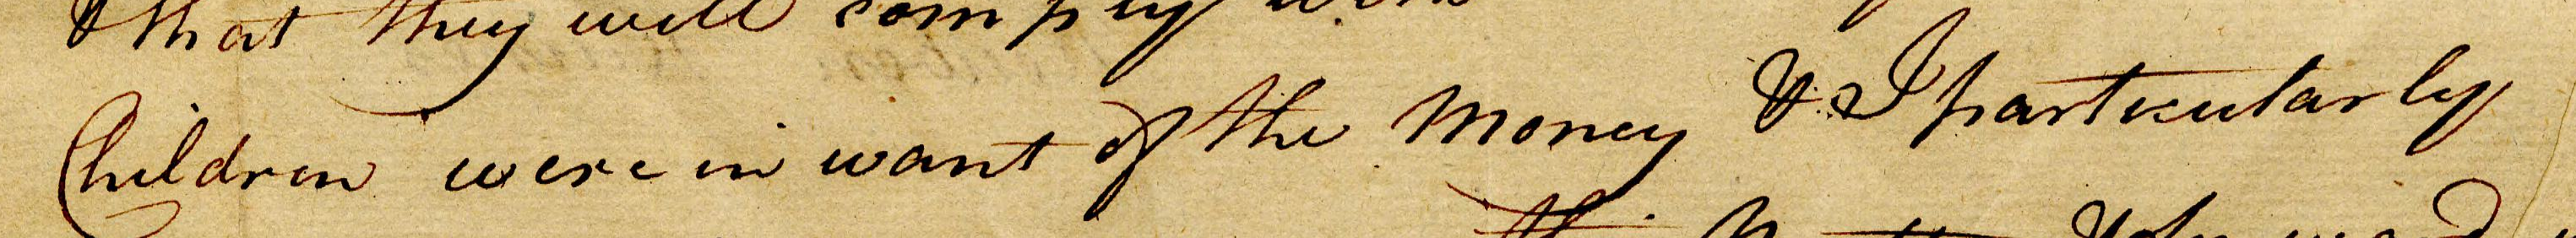Children were in want of the money & I particularly
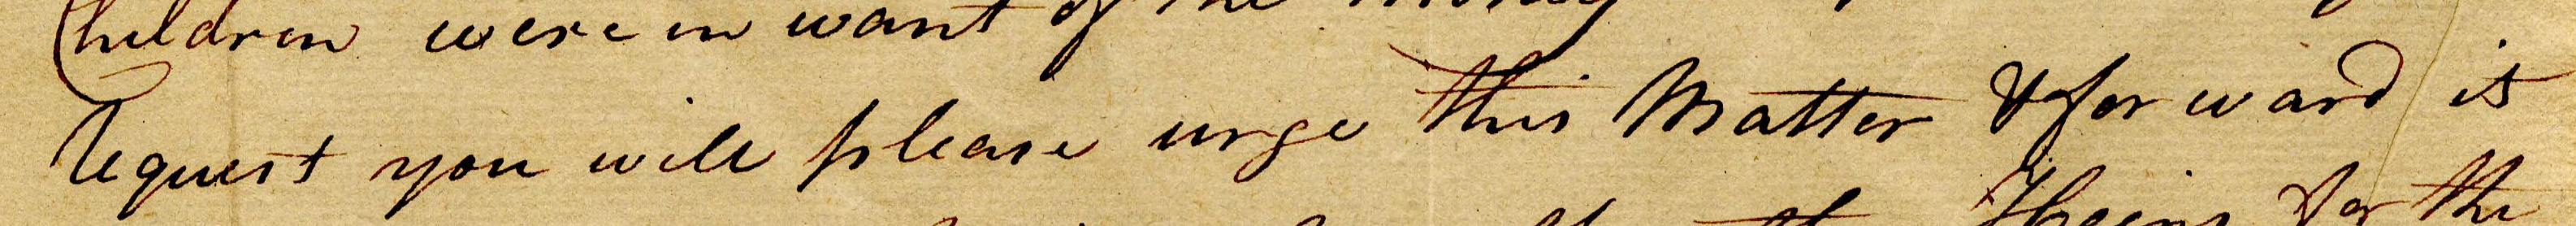request you will please urge this Matter & forward it
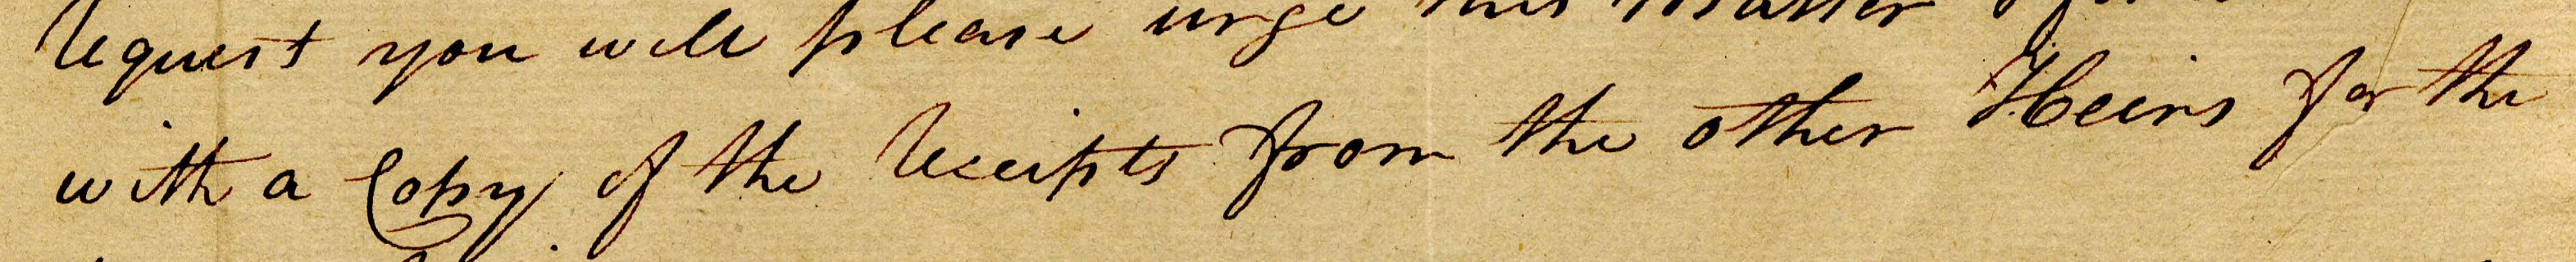with a Copy of the receipts from the other Heirs for the
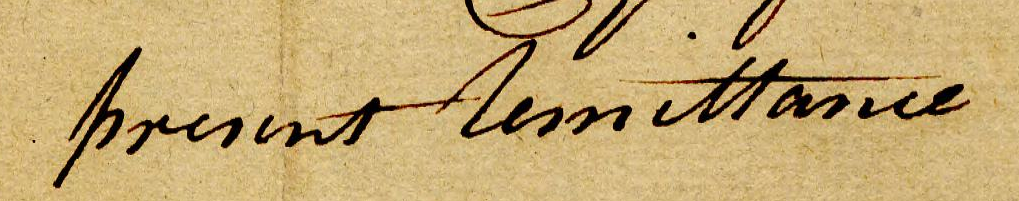present Remittance
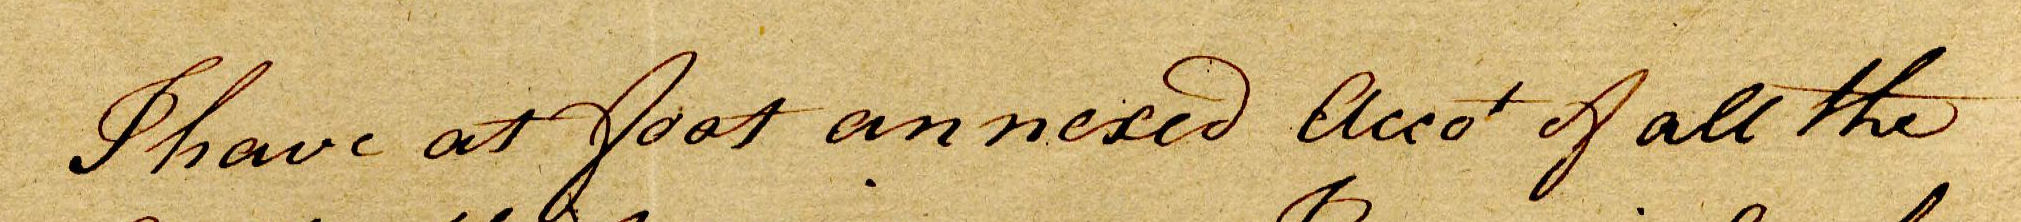I have at foot annexed Accot of all the
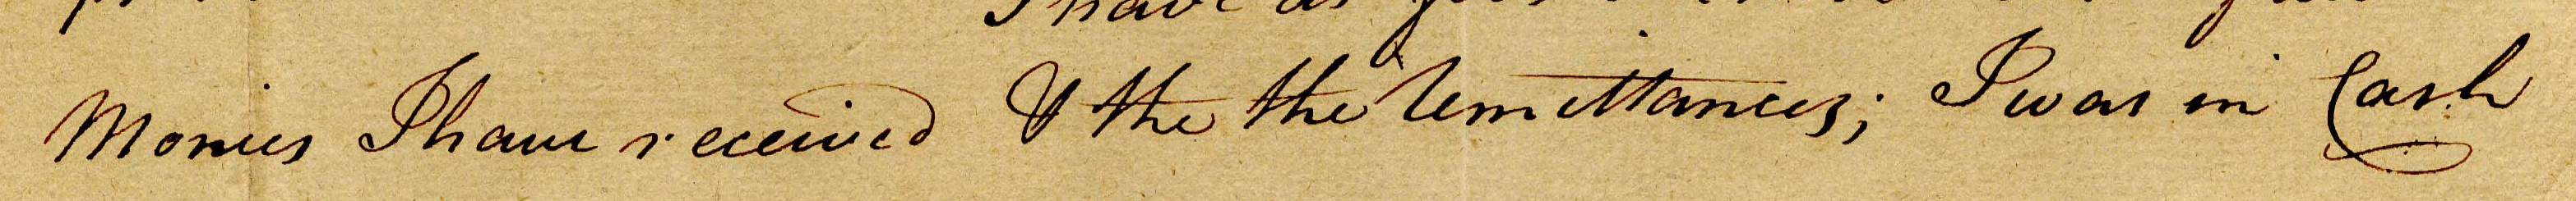Monies I have received & the the reimttances; I was in Cash
